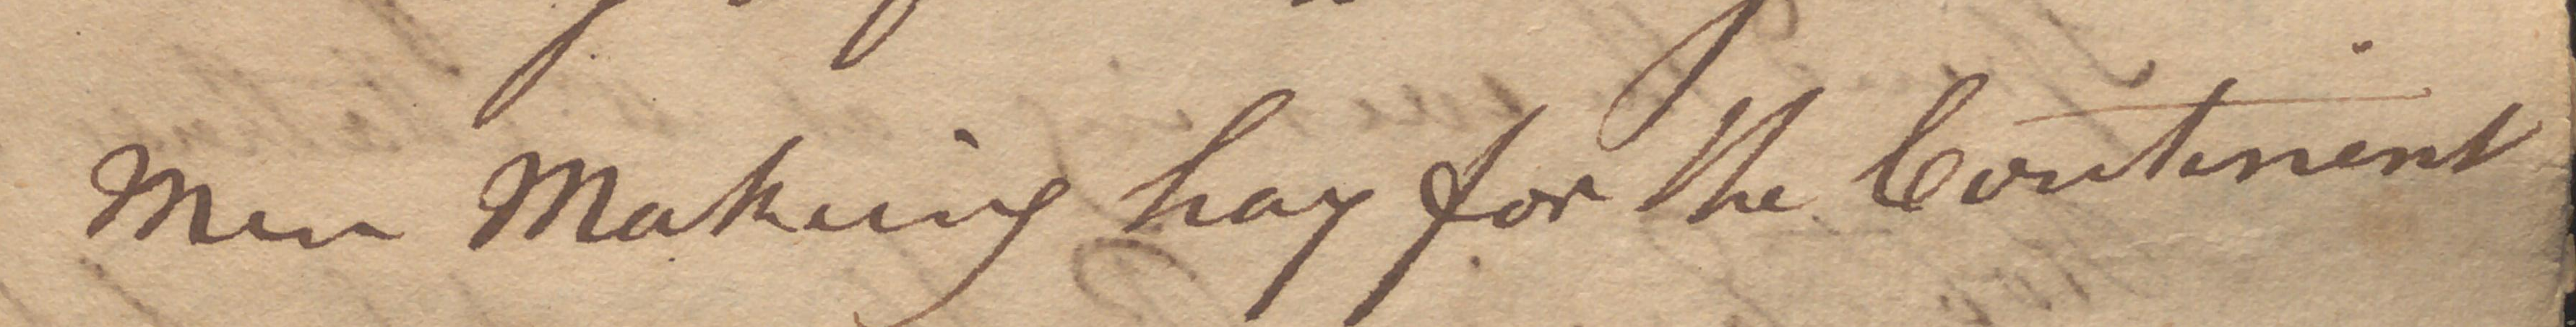Men Makeing hay for the Continent
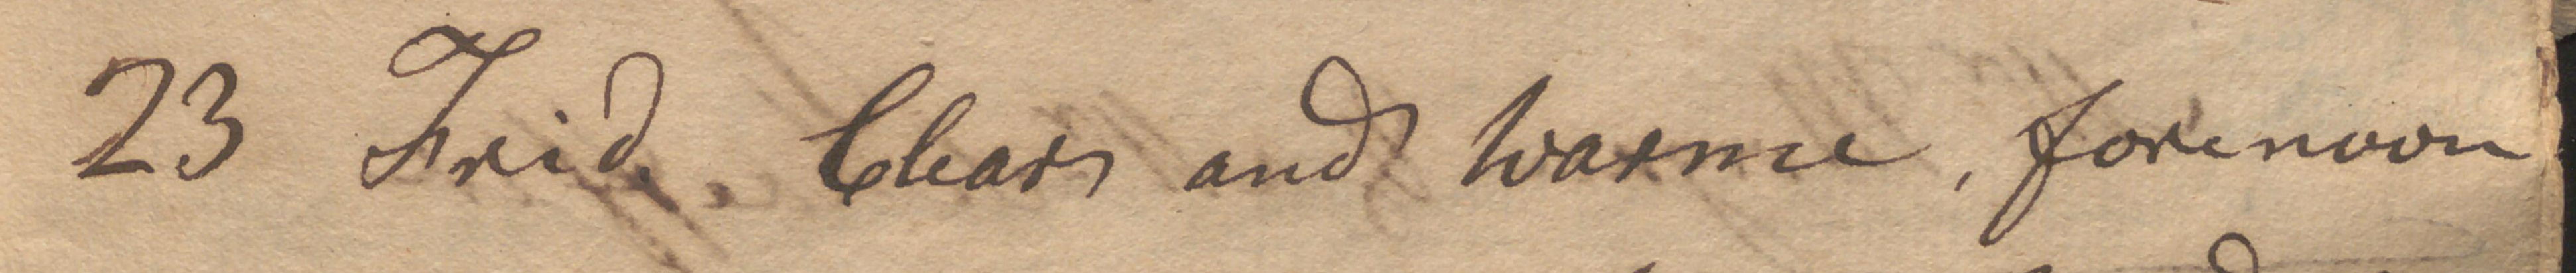23 Frid. Clear and warme, forenoon
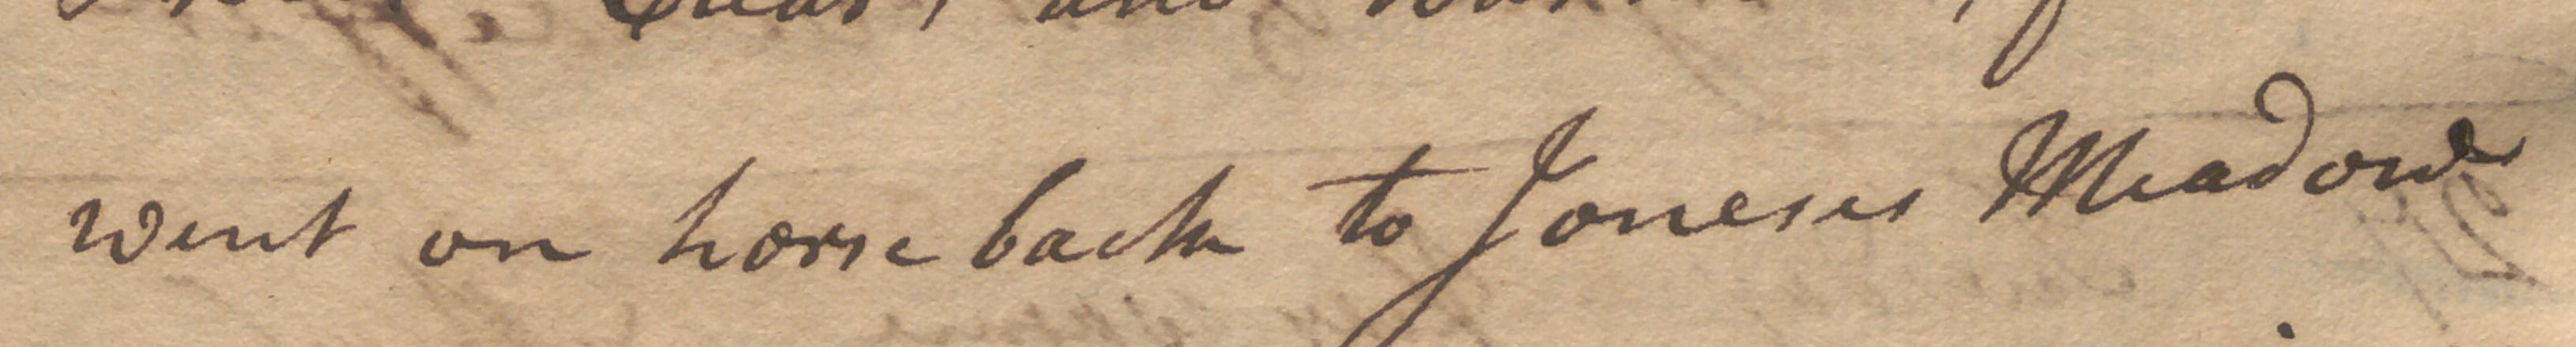went on horse back to Joneses Meadow
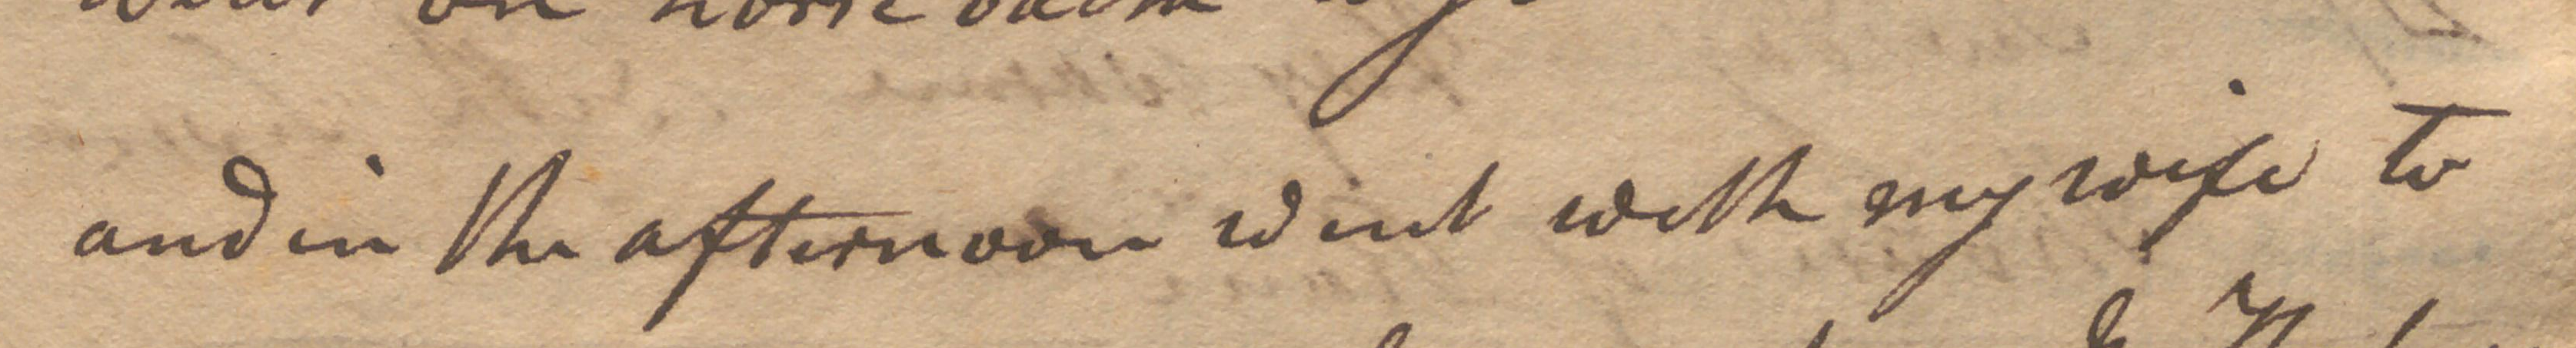and in the afternoon went with my wife to
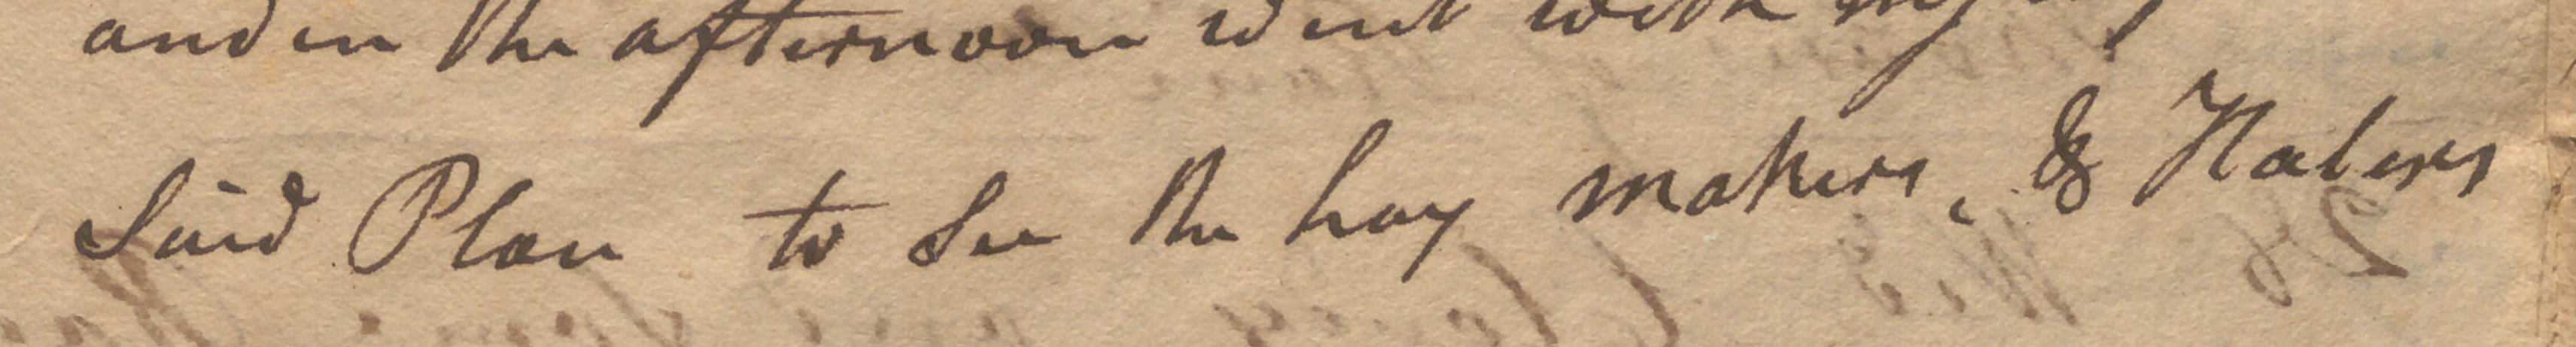said Place to see the hay makers, & Halers
